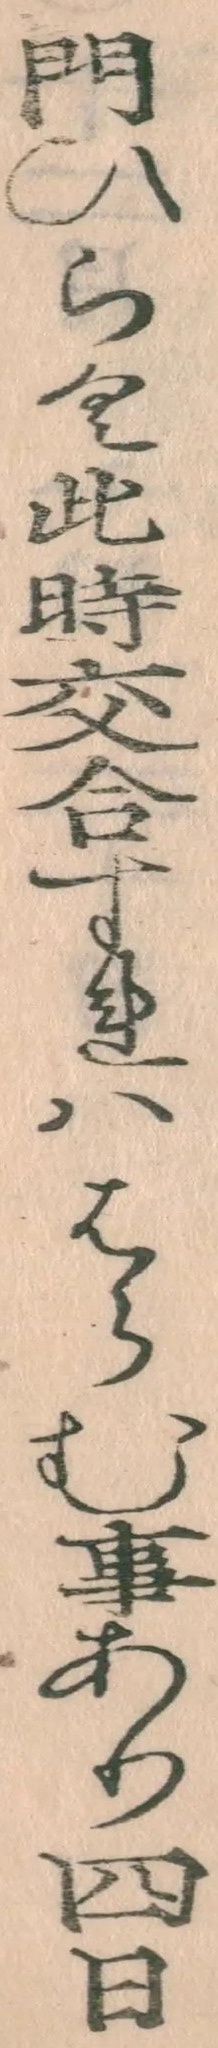門ひらく此時交合すれははらむ事あり四日
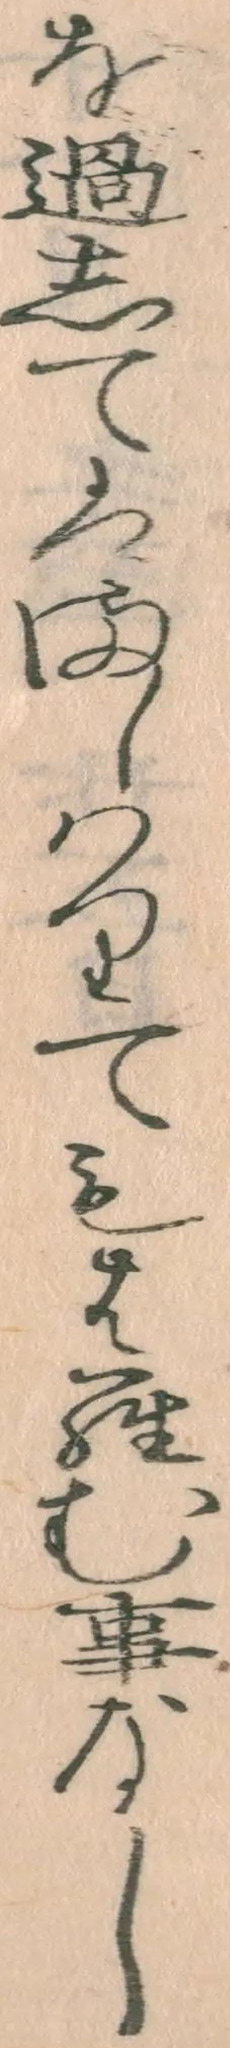を過してはましわりてもはらむ事なし
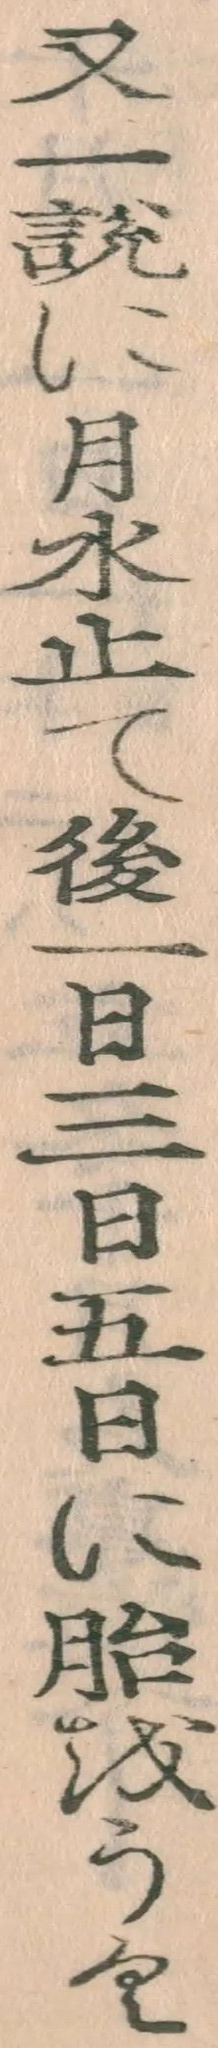又一説に月水止て後一日三日五日に胎をうく
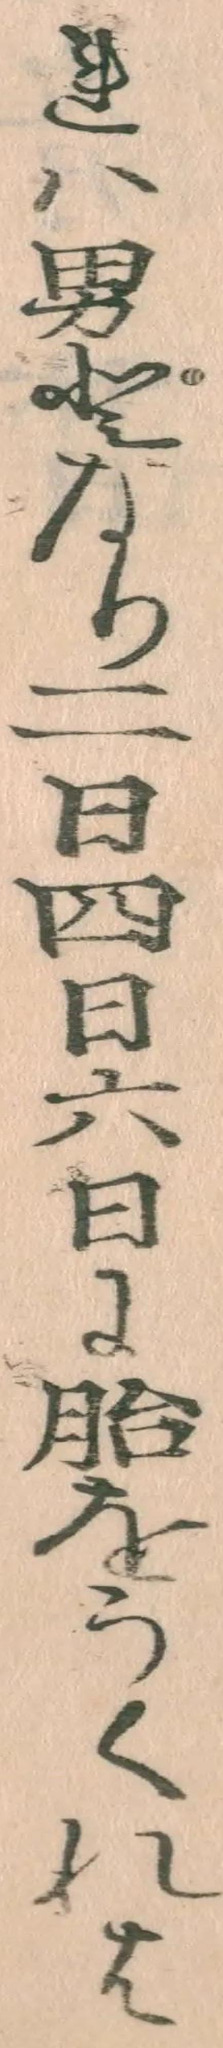れは男となり二日四日六日に胎をうくれは
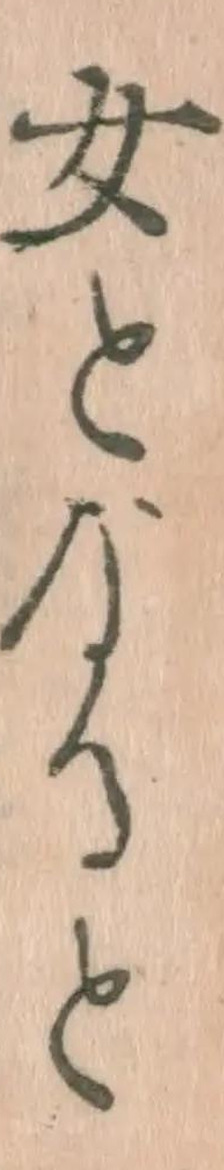女となると
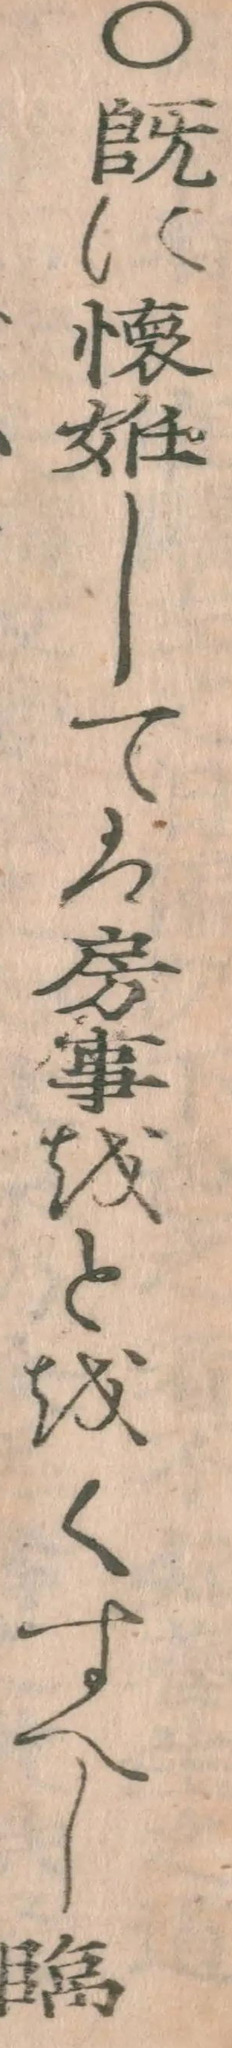〇既に懐妊しては房事をとをくすへし臨
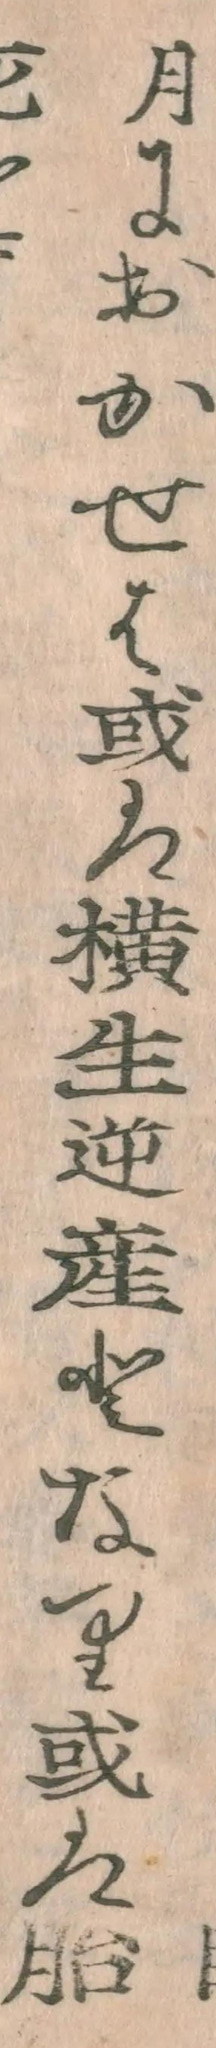月におかせは或は横生逆産となり或は胎
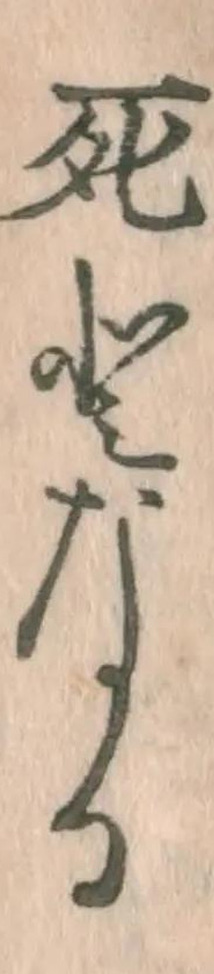死となる
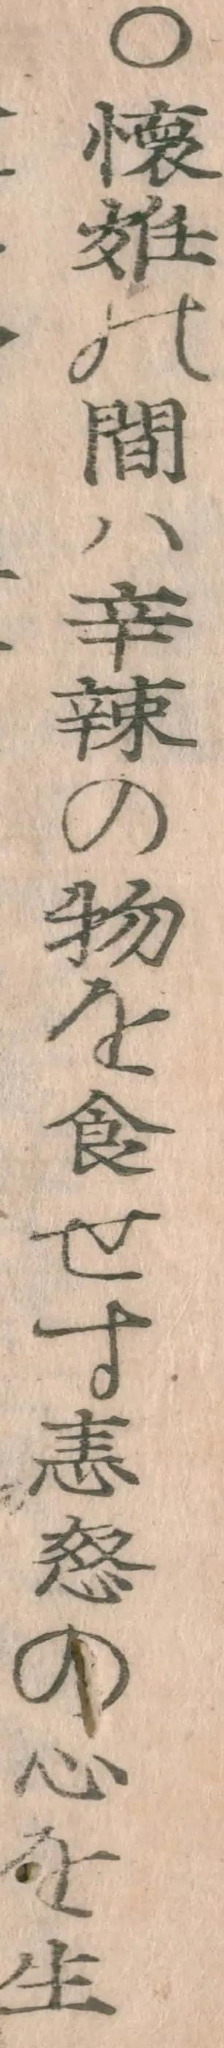〇懐妊の間は辛辣の物を食せす恚怒の心を生
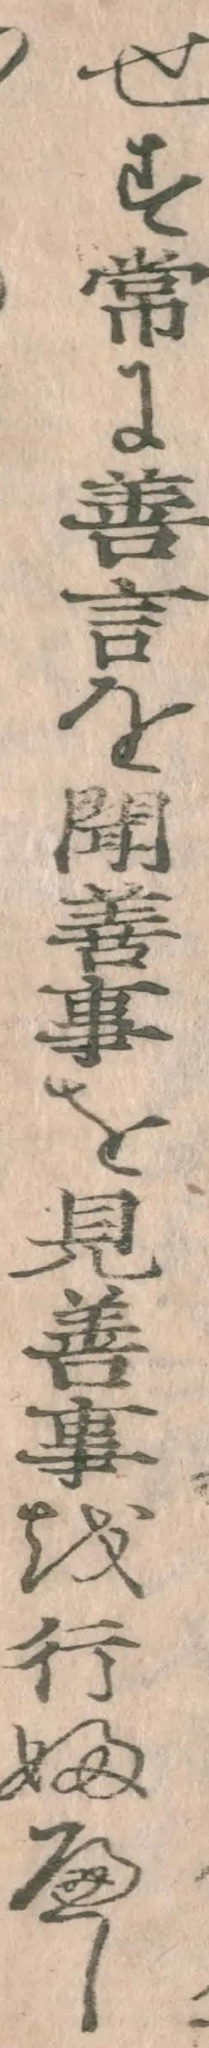せす常に善言を聞善事を見善事を行ぬへし
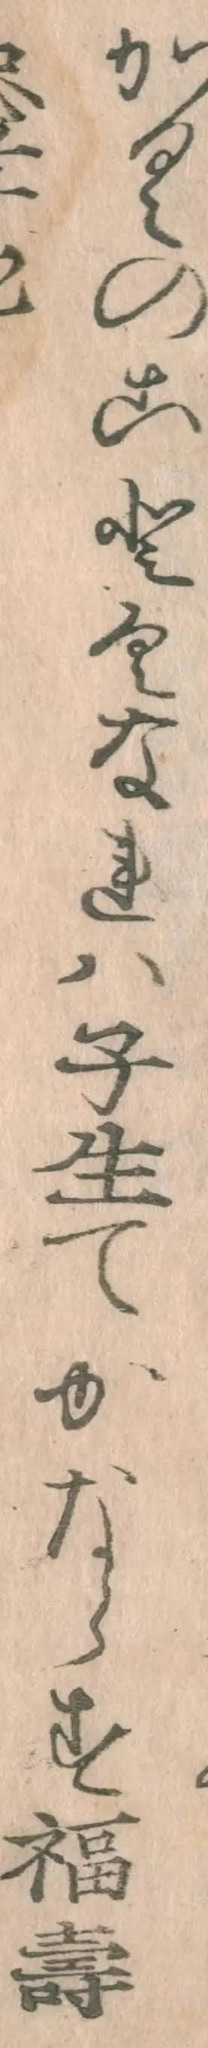かくのことくなれは子生てかならす福寿
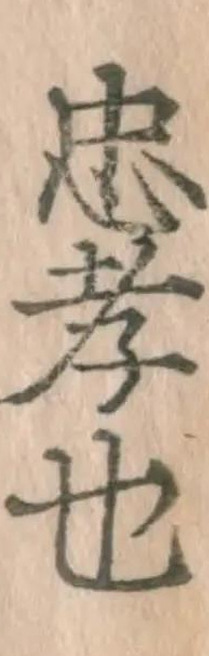忠孝也

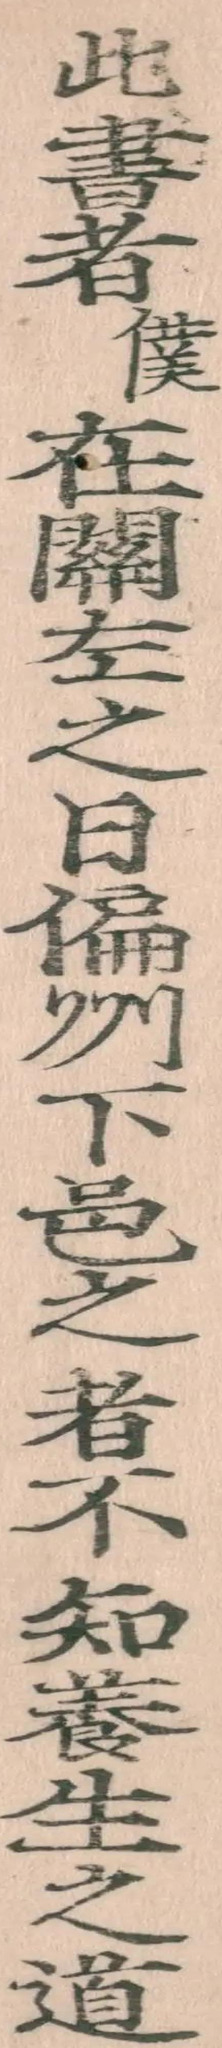此書者僕在関左之日偏州下邑之者不知養生之道
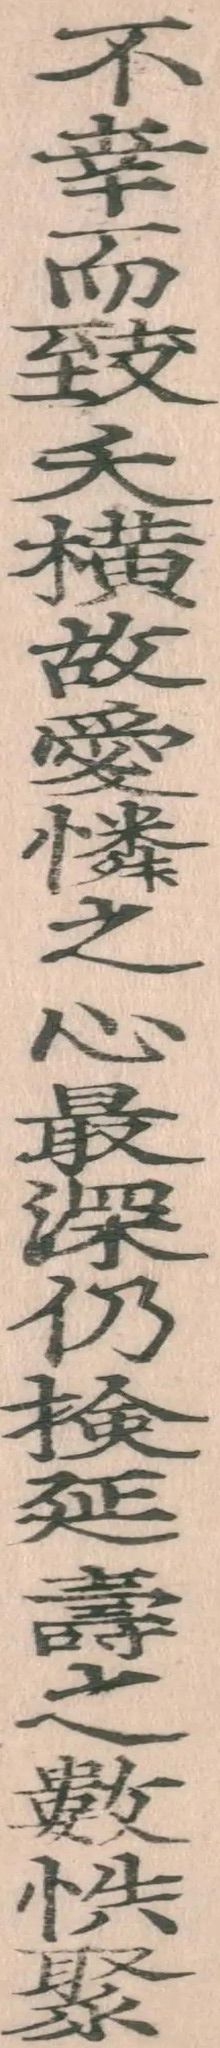不幸而致夭横故愛憐之心最深仍検査延寿之数供聚
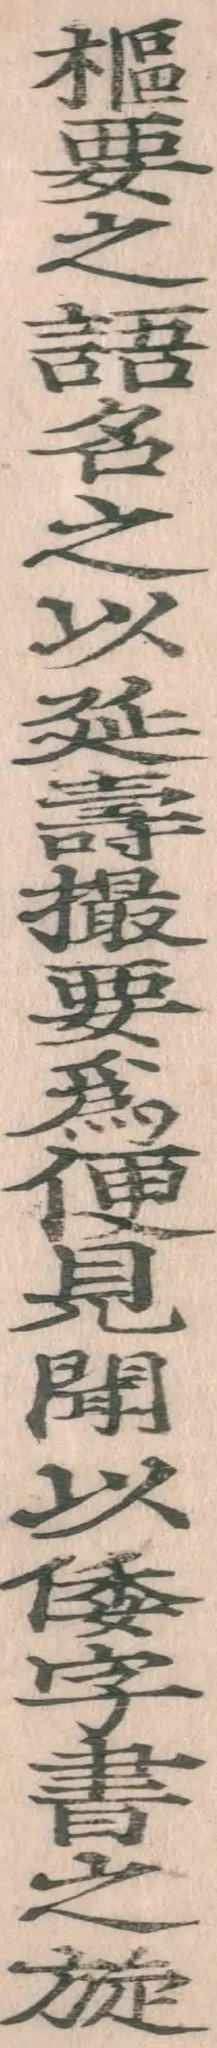枢要之語名之以延寿撮要為便見聞以倭字書之旋
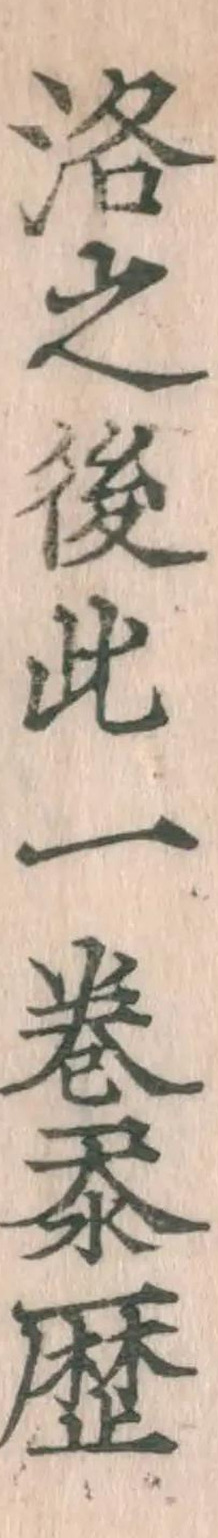洛之後此一巻沗歴
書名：延壽撮要
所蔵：国立国会図書館 National Diet Library, JAPAN
